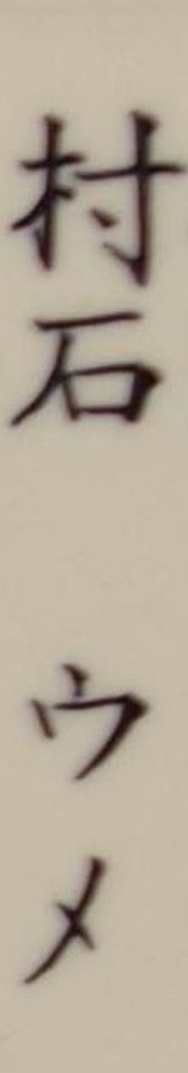村石ウメ
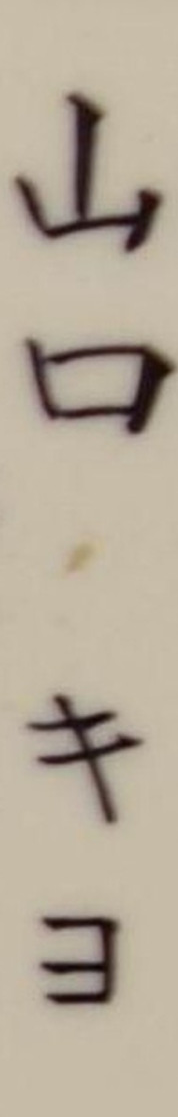山口キヨ
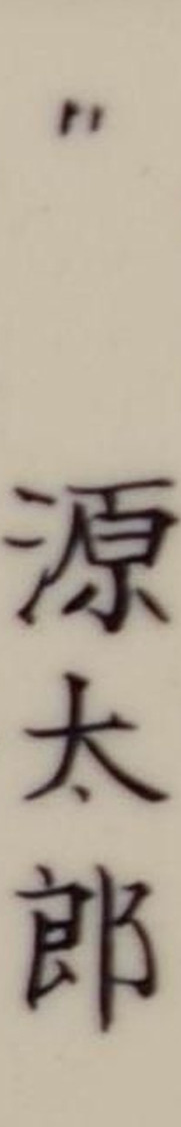源太郎
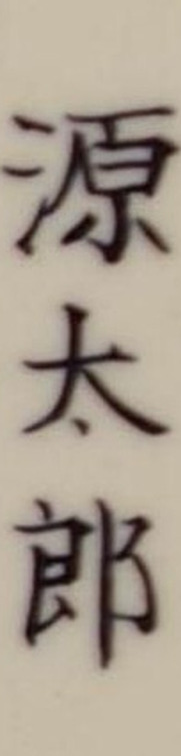源太郎
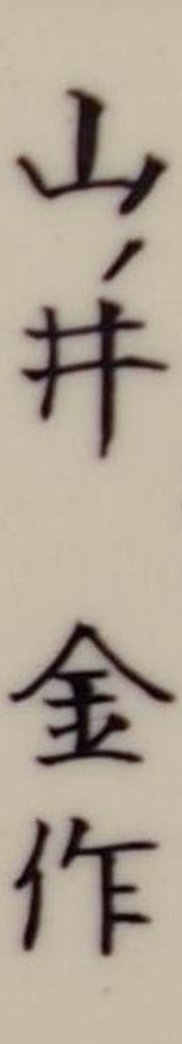山ノ井金作
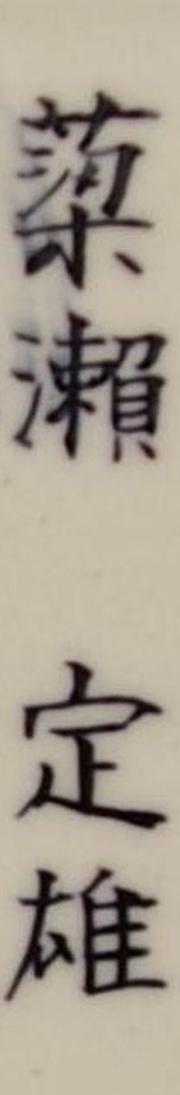梁瀬定雄
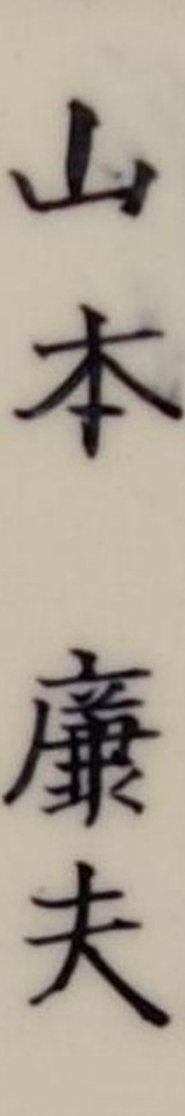山本康夫
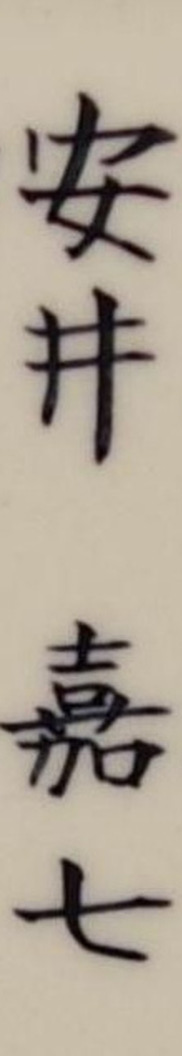安井嘉七
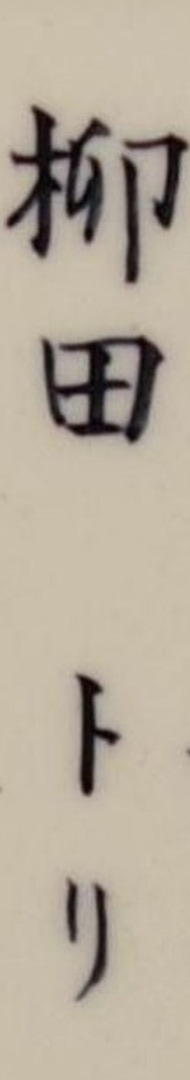柳田トリ
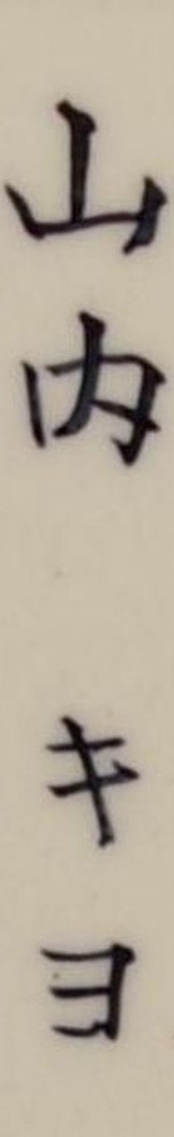山内キヨ
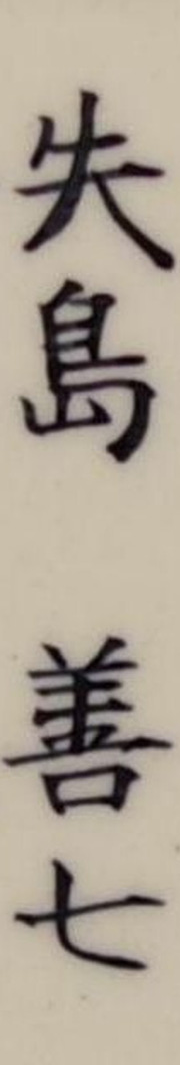失島善七
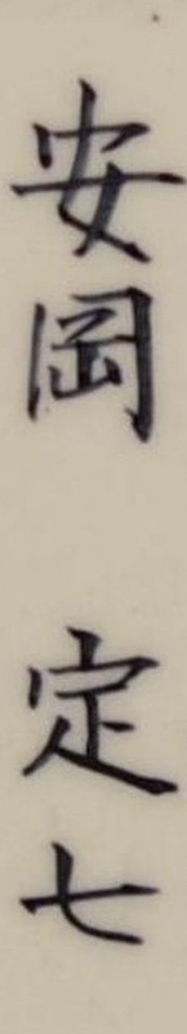安岡定七
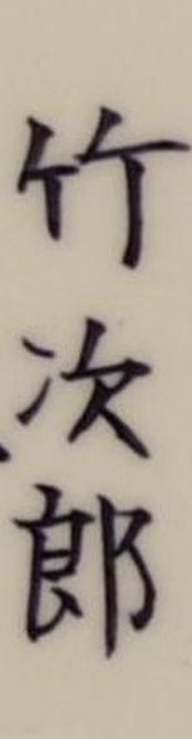竹次郎
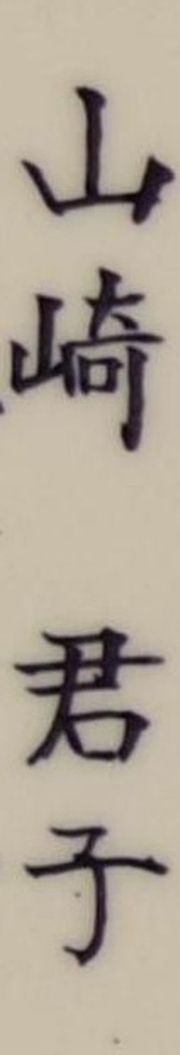山崎君子
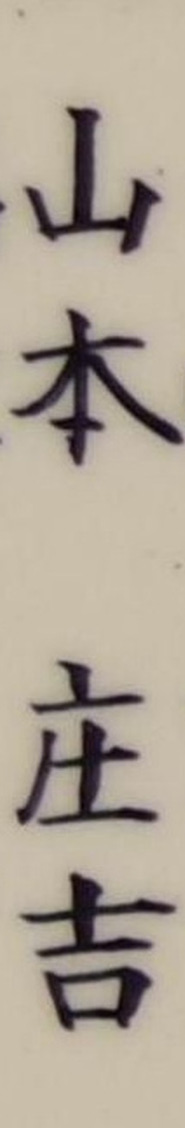山本庄吉
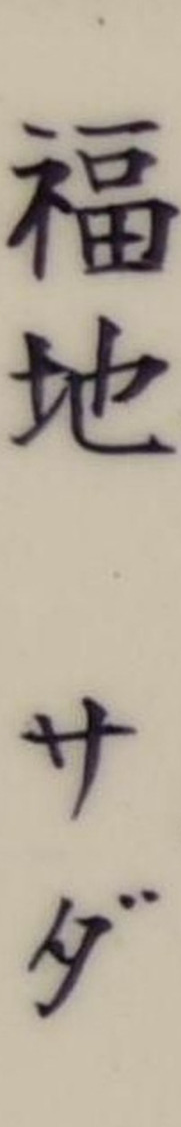福地サダ
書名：M~S
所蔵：高野山金剛峯寺
